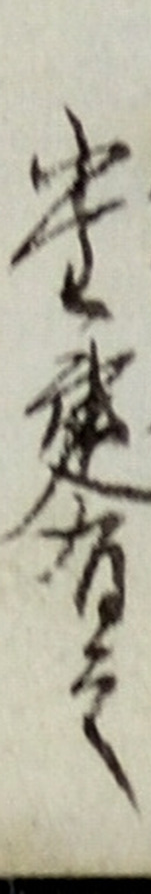堂建有之

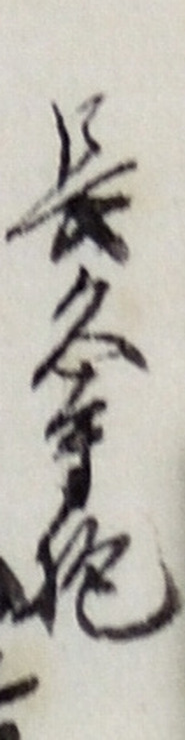長久寺抱
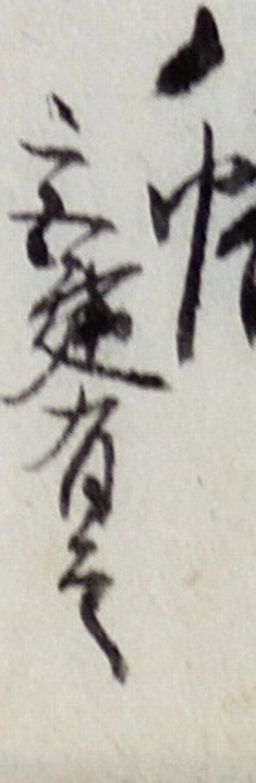宮建有之
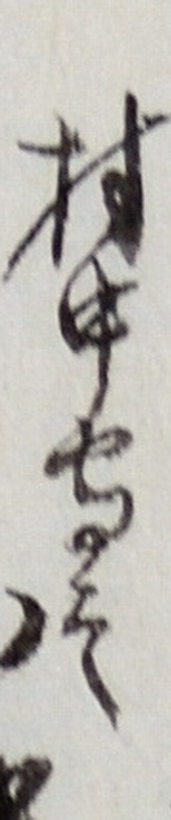村中守之
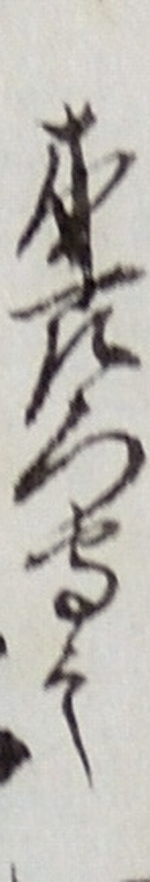杢左衛門守之
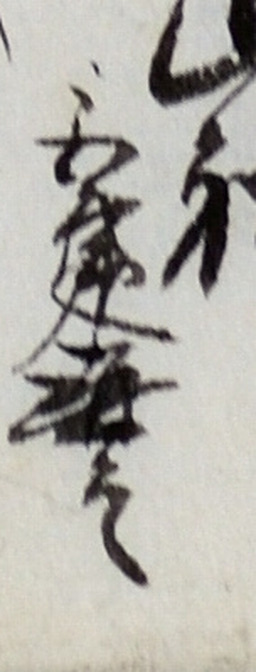宮建無之
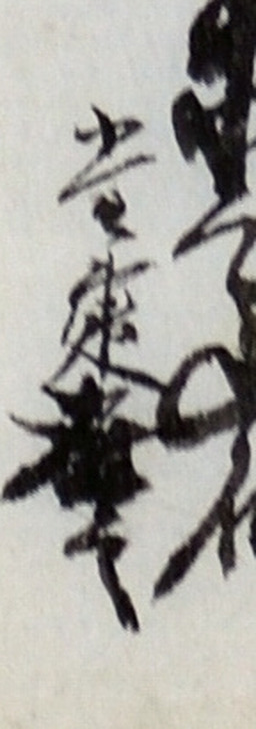堂建無之
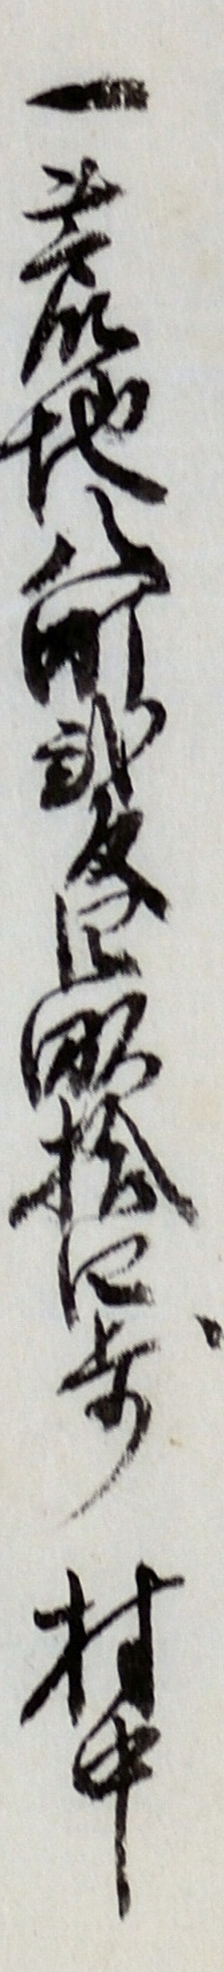一荒地八町弐反四畝四歩村中
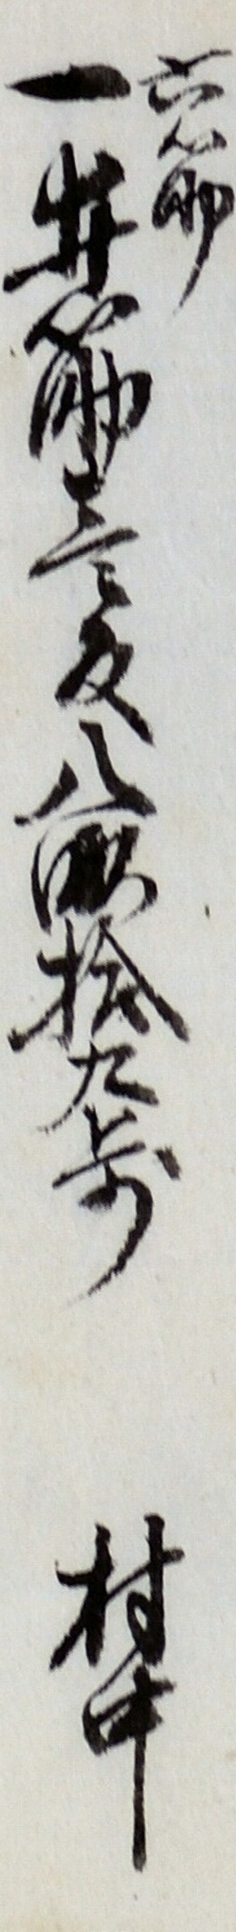一井筋壱反八畝拾九歩村中
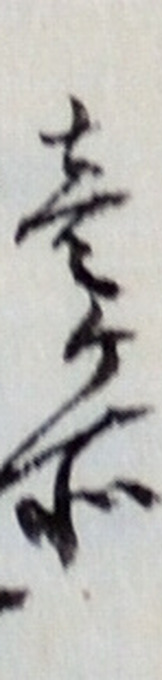壱ヶ所
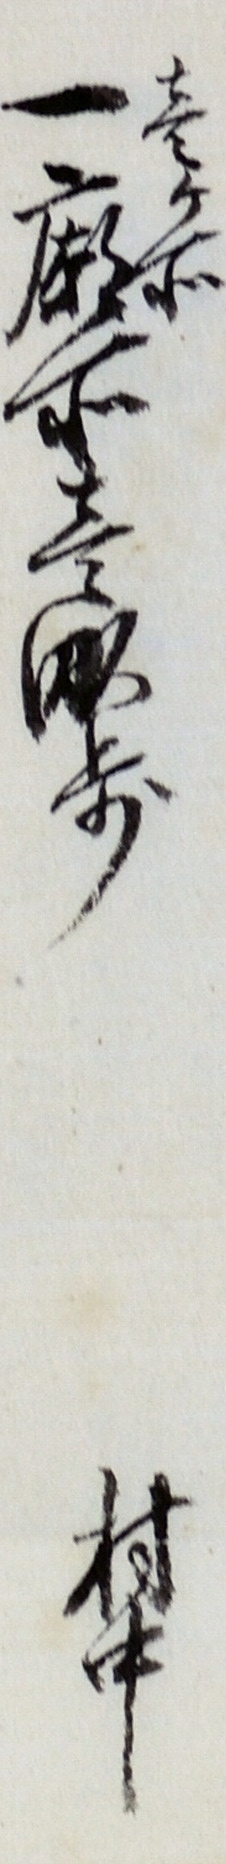一廟所壱畝歩村中
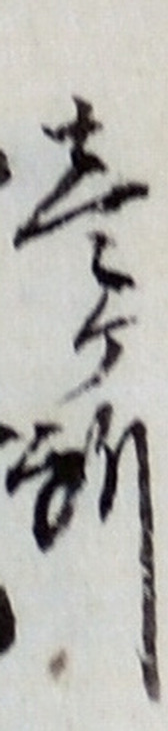壱ヶ所
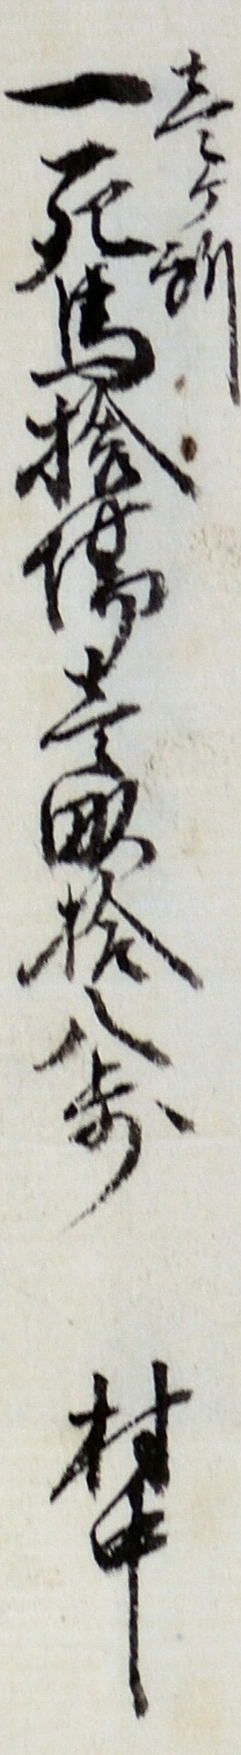一死馬捨場壱畝拾八歩村中
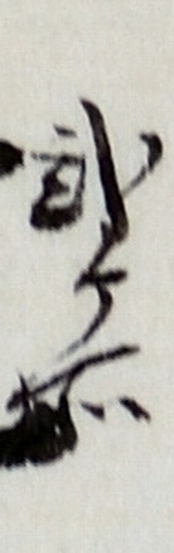壱ヶ所
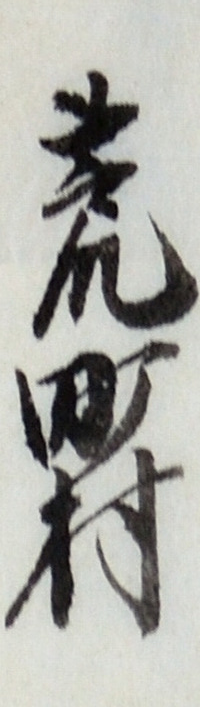荒町村
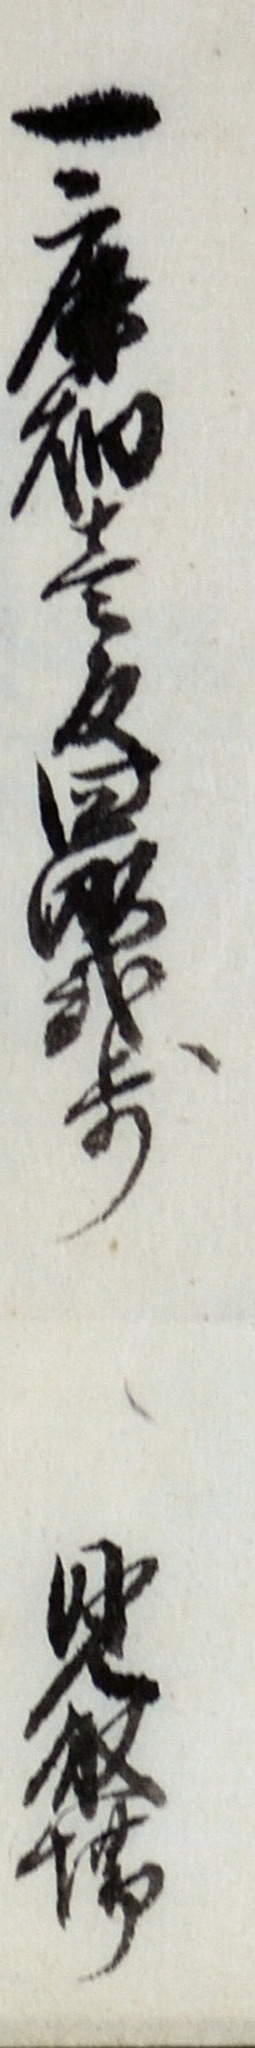一麻畑壱反四畝弐歩見取場
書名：御領分中山林社地手控
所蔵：伊那市立高遠町図書館・合同会社AMANE
